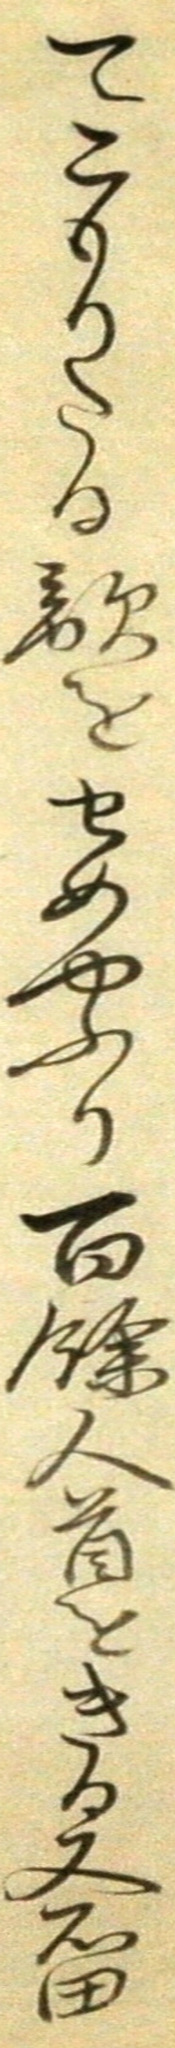てこもりたる敵をせめやふり百余人首をきる又石田
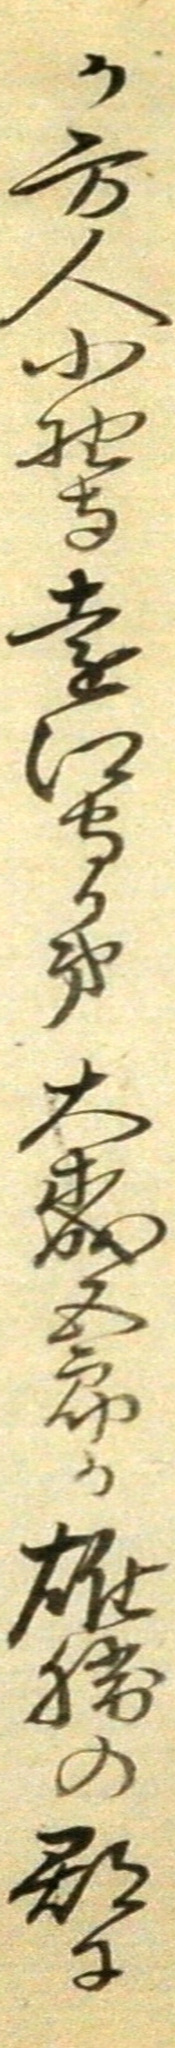か方人小野寺遠江守か弟大森五郎か雄勝の郡に
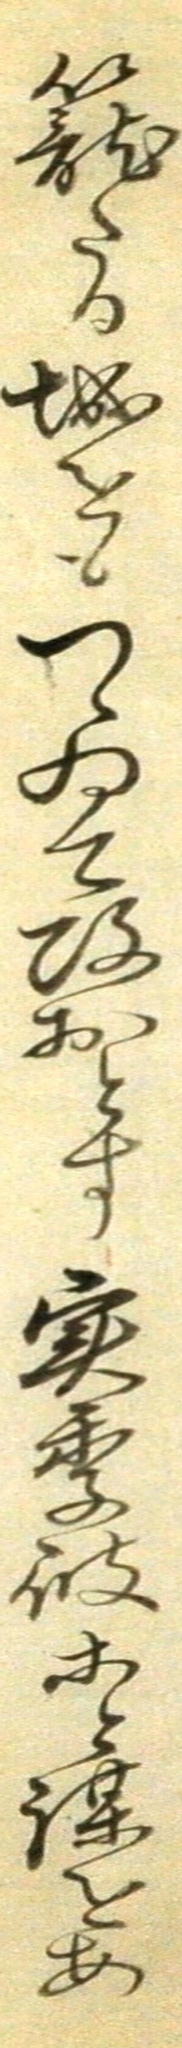籠たる城をもつゝゐて攻おとす実季彼等と謀をあ
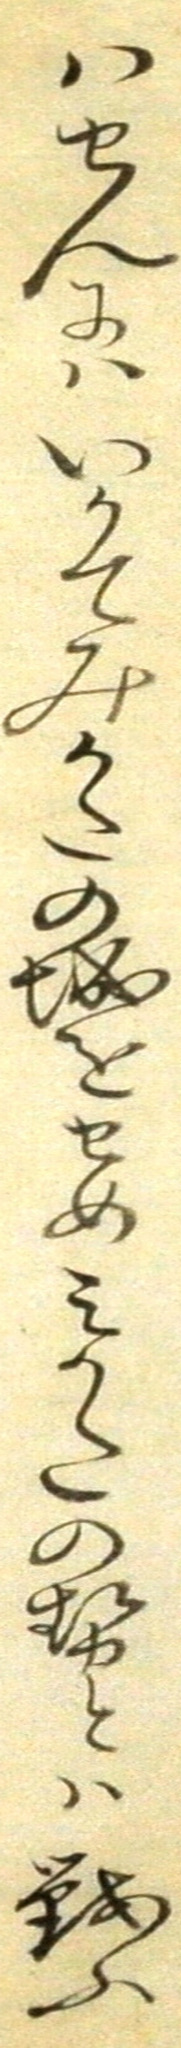はせんにはいかてみかたの城をせめみかたの勢とは戦ふ
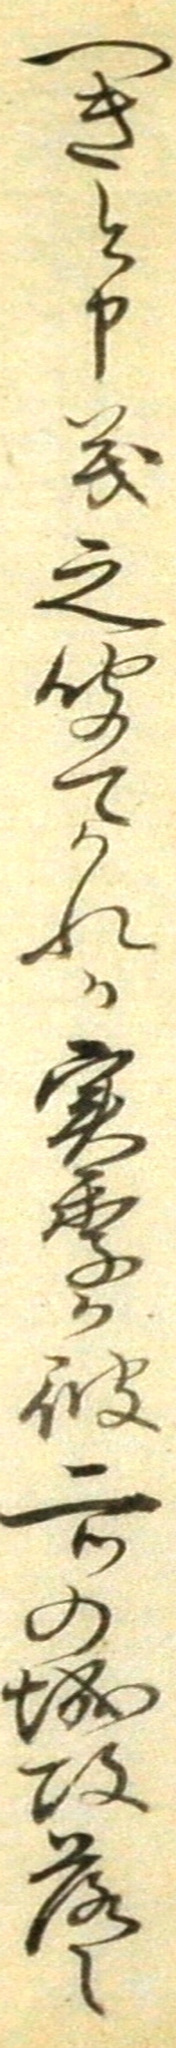へきと申義之聞てかれか実季か彼二ツの城攻落し
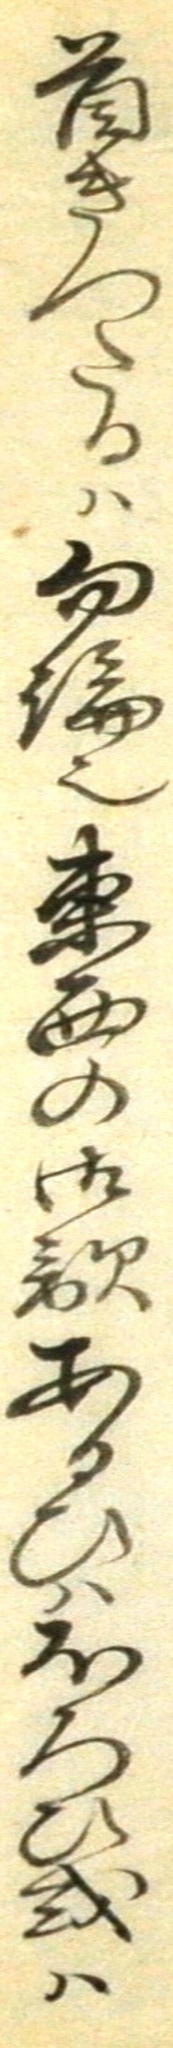首きつたるは勿論也東西の御敵あるひはほろひ或は
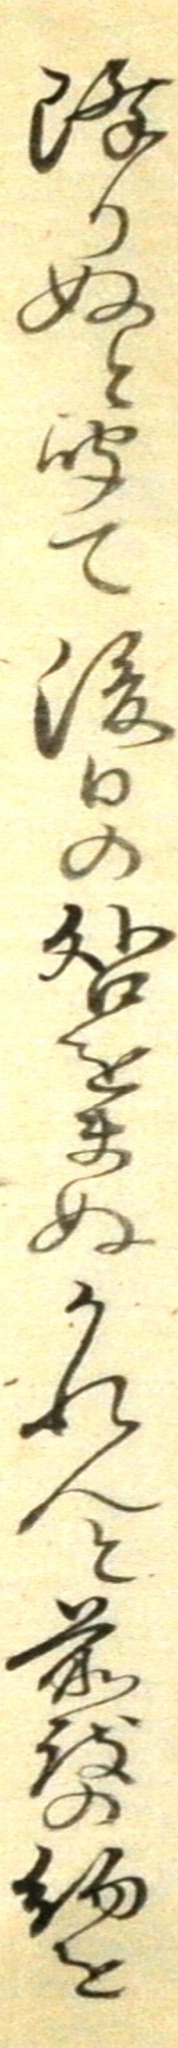降りぬと聞て後日の咎をまぬかれんと前度の約を
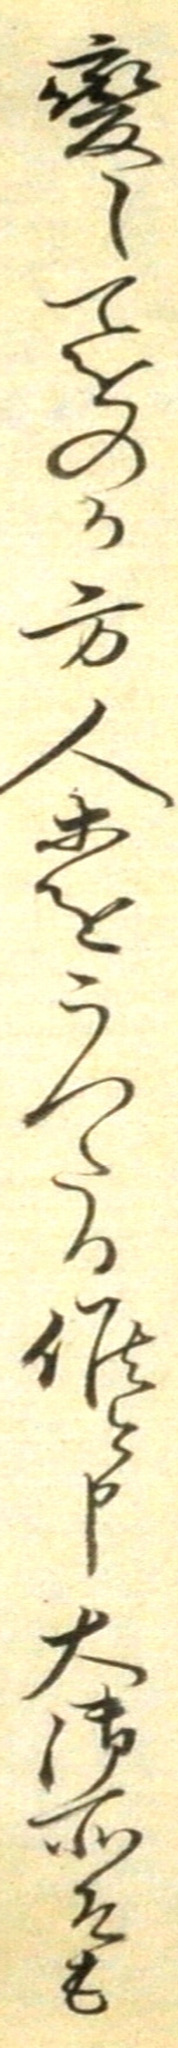変してをのか方人等をうつたる候と申大御所そも
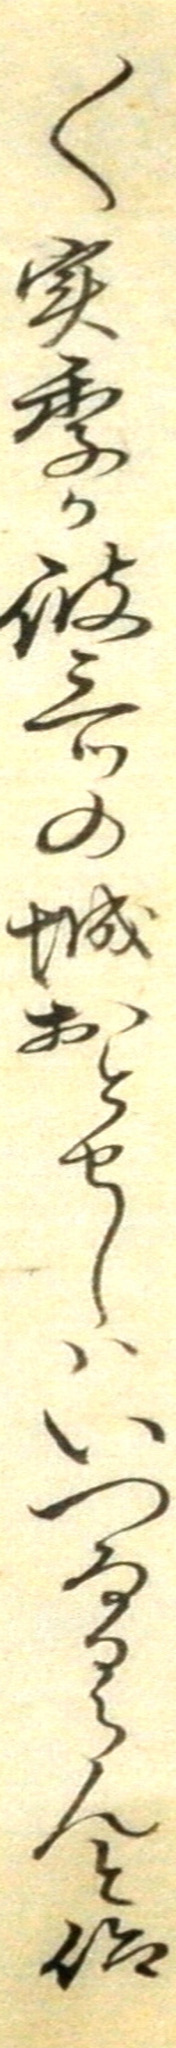〳〵実季か彼三ツの城おとせしはいつなるらんと仰
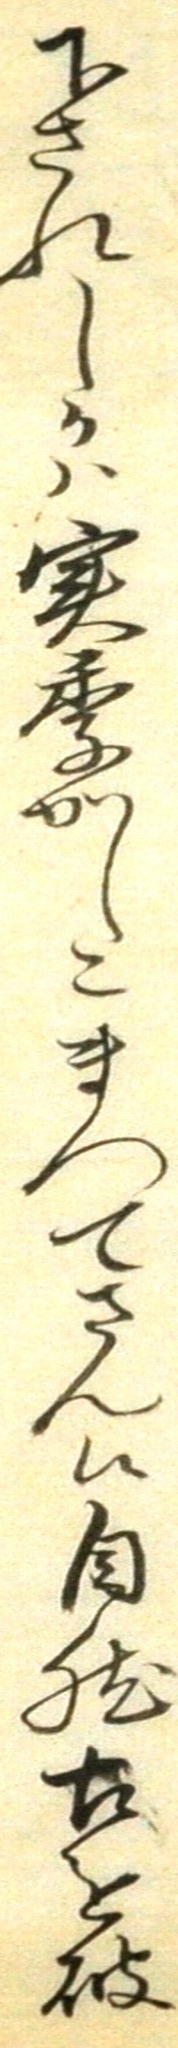下されしかは実季かしこまつてさん候自然古を破
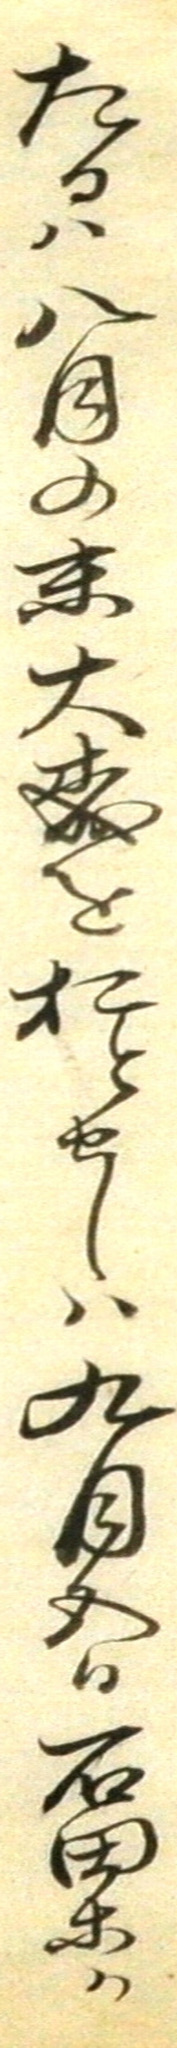たるは八月の末大森をおとせしは九月五日石田等か
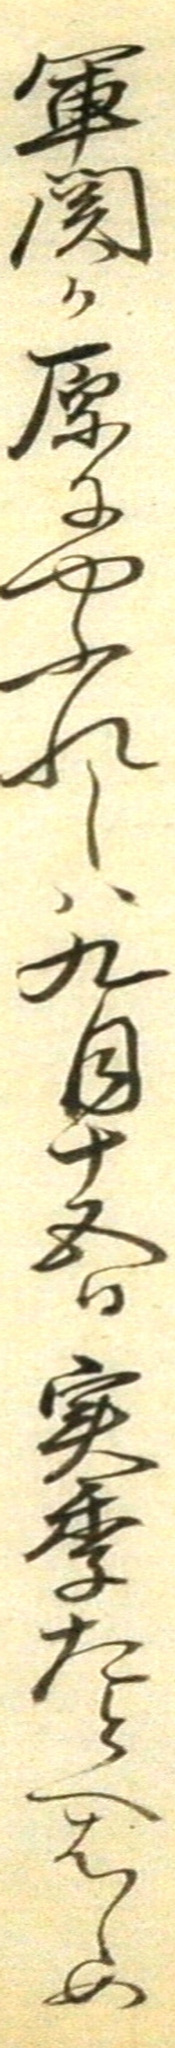軍関ヶ原にやふれしは九月十五日実季たとへはしめ
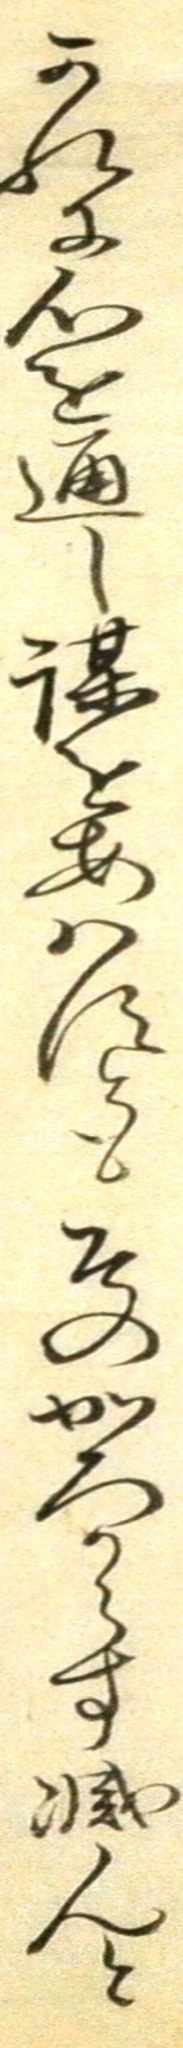かれに心を通し謀をあはすともそのかろからす滅んと
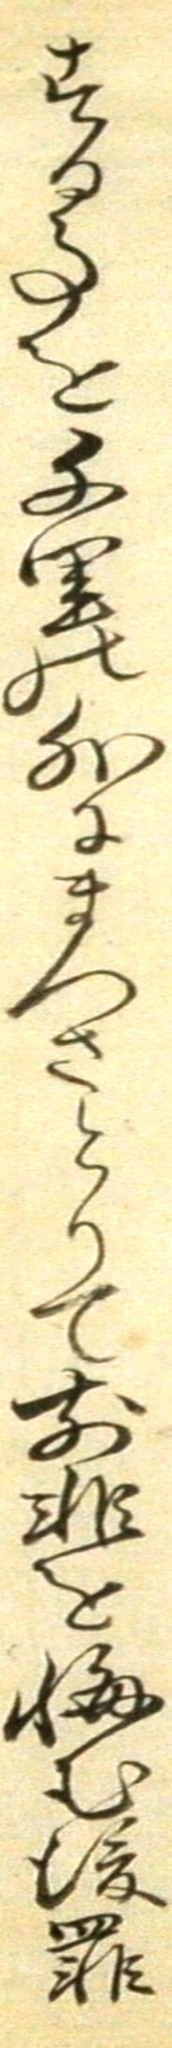する事を千里の外にまつさとりて前非を悔む後罪
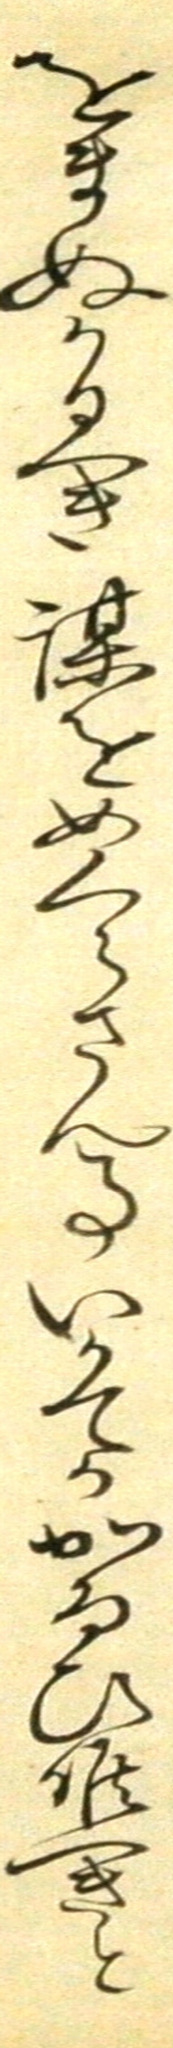をまぬかるへき謀をめくらさん事いかてかかるひ候へきと
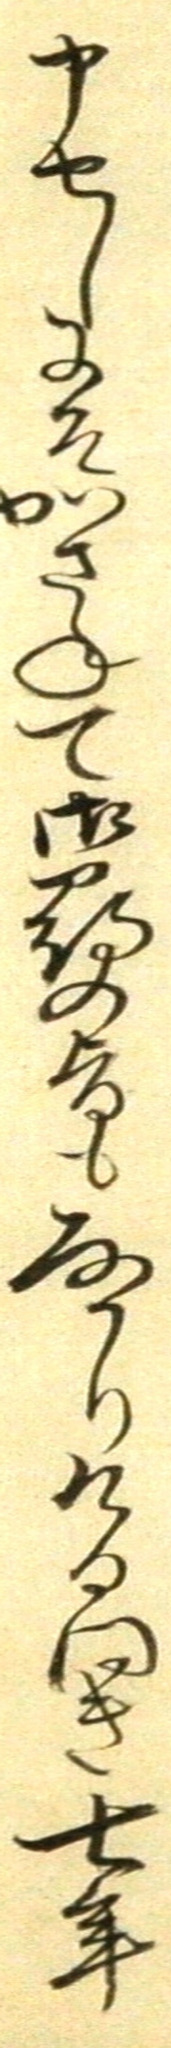申せしにそかさねて御尋の旨もなかりける同き七年
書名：藩翰譜（八・下）
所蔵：伊那市立高遠町図書館・合同会社AMANE
